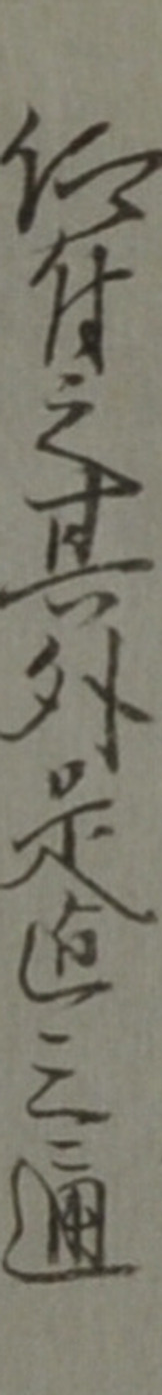仰付之其外是迄之通
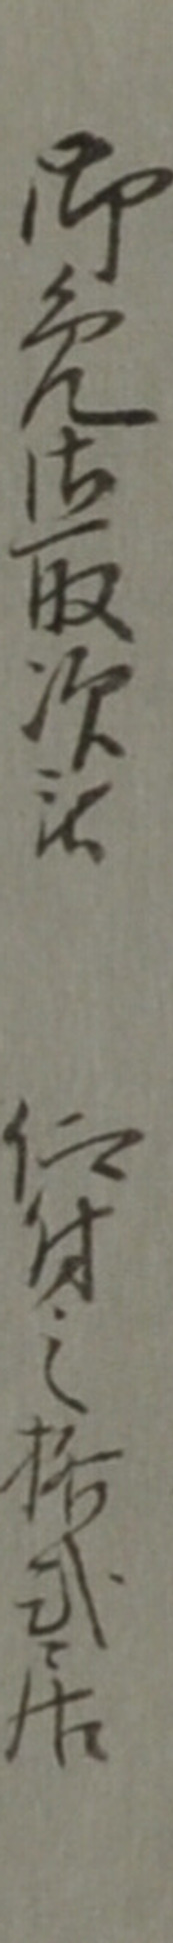御免御取次被仰付之格式居
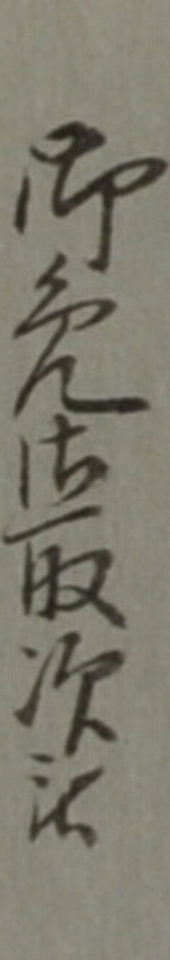帯御免御取次被
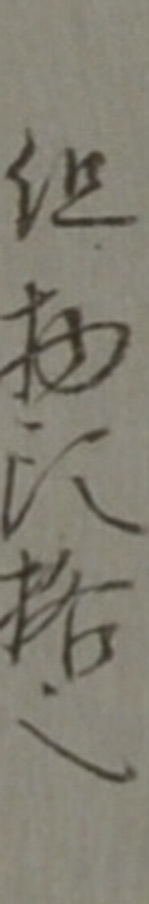但物頭格也
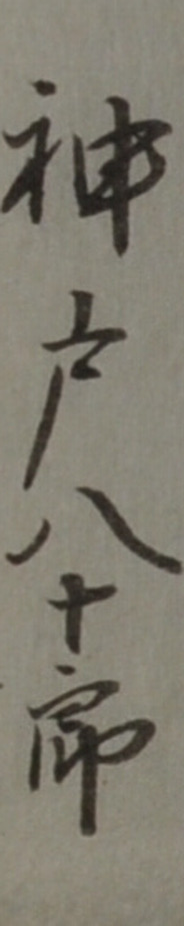神戸八十郎
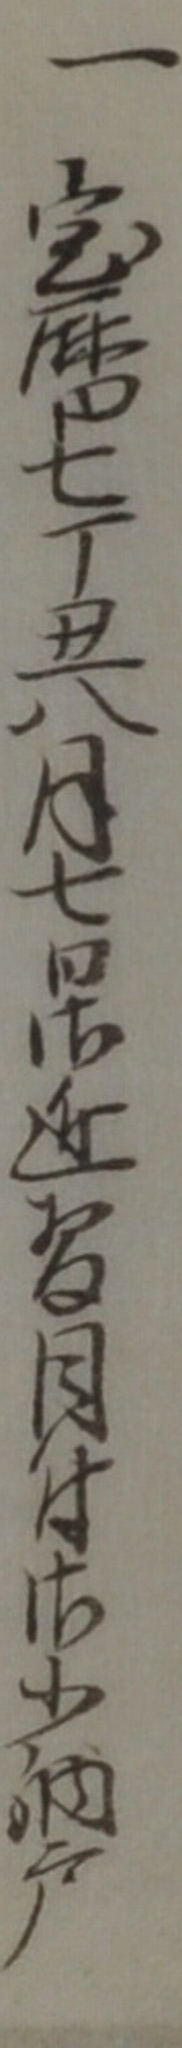一宝暦七丁丑八月七日御近習目付御小納戸
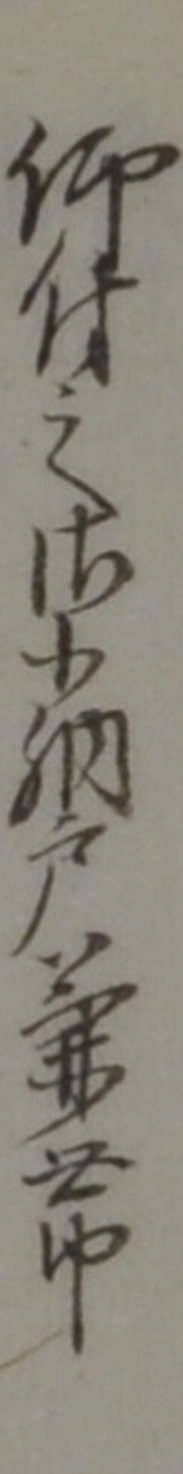仰付之御小納戸兼帯
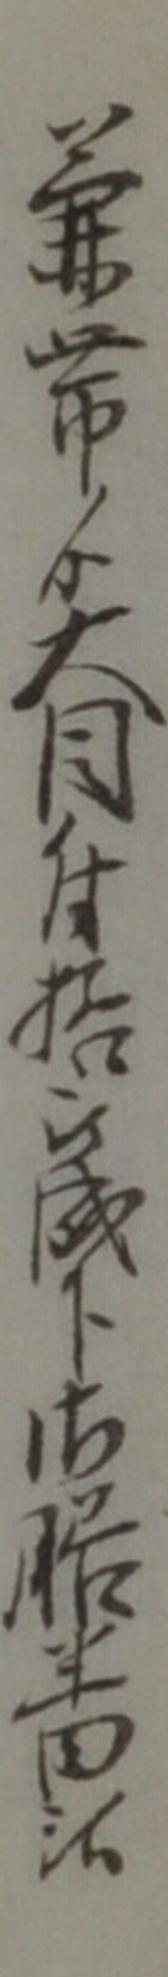兼帯ゟ大目付格被成下御膳番被
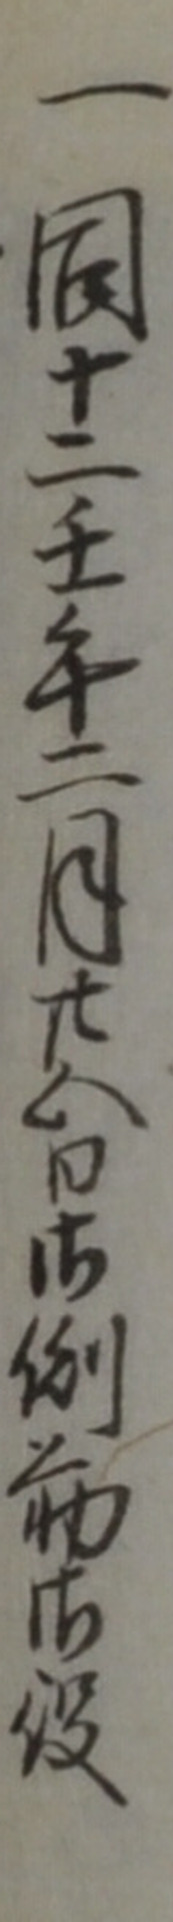一同十二壬午二月廿五日御側勤御役
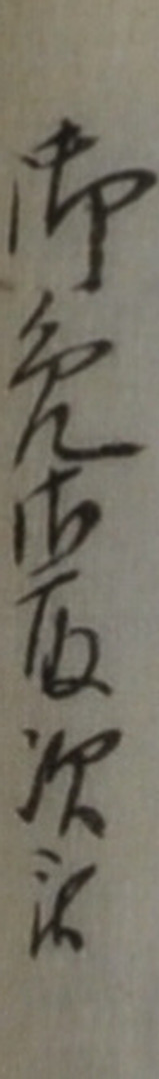帯御免御取次被
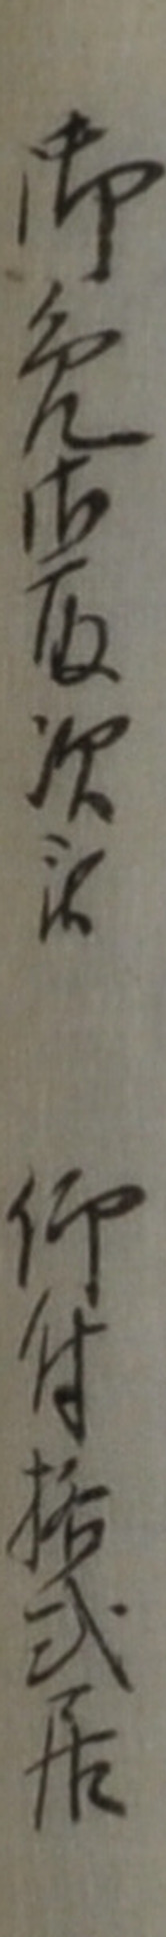御免御取次被仰付格式居
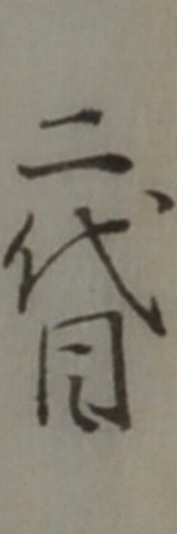二代目
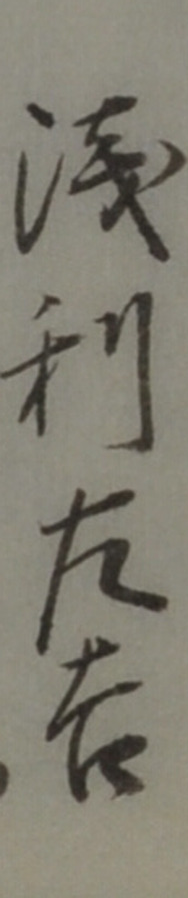浅利左吉
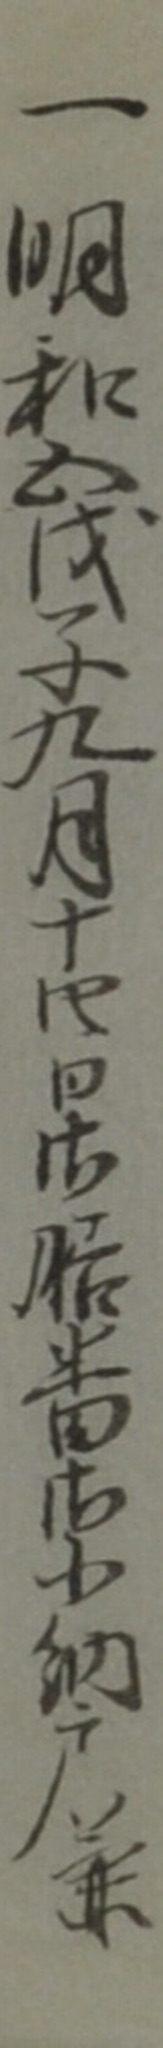一明和五戊子九月十四御膳番御小納戸兼
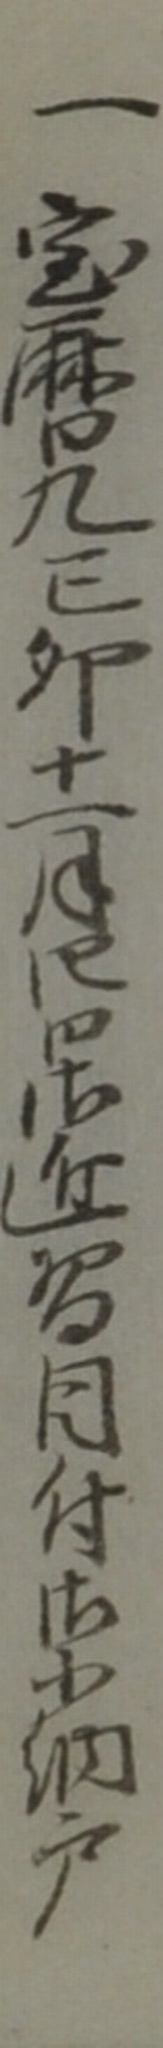一宝暦九己卯十一月四日御近習目付御小納戸
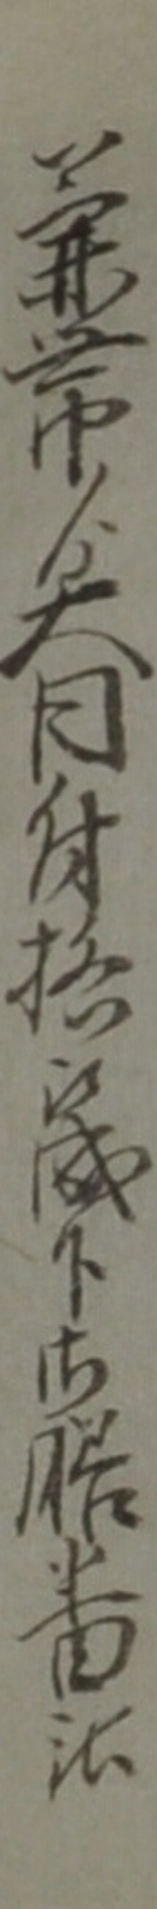戸兼帯ゟ大目付格被成下御膳番被
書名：諸御役代々録（四）
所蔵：伊那市立高遠町図書館・合同会社AMANE
